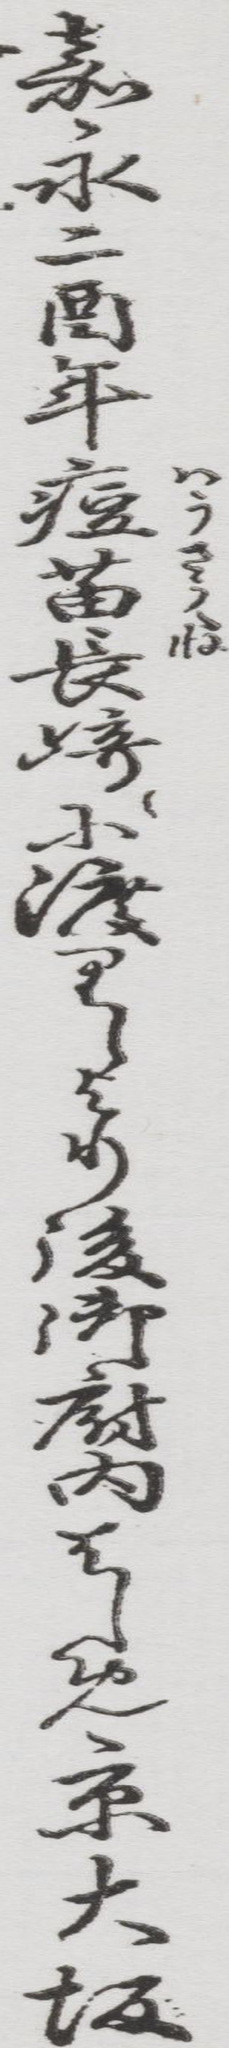嘉永二酉年痘苗長崎に渡りしより後御府内はしめ京大坂
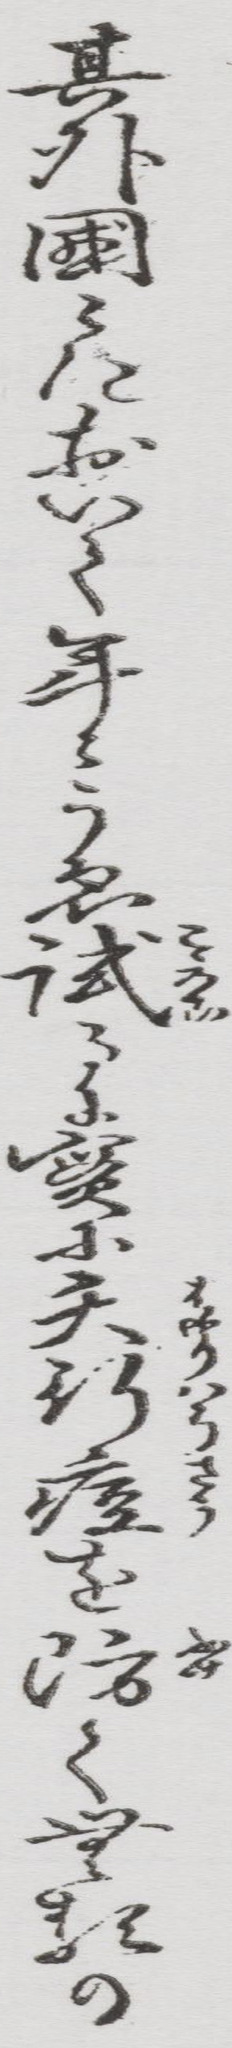其外国々において年々うゑ試るに実に夭行痘を防く無類の
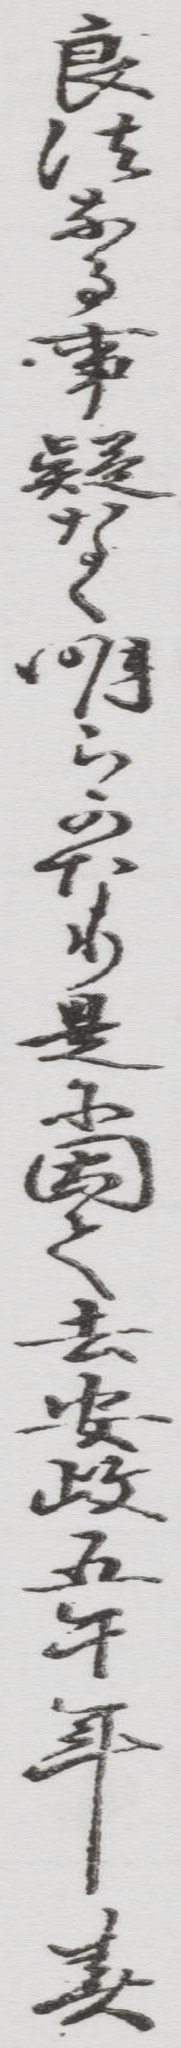良法なる事疑なく明らかなり是に因て去安政五午年春
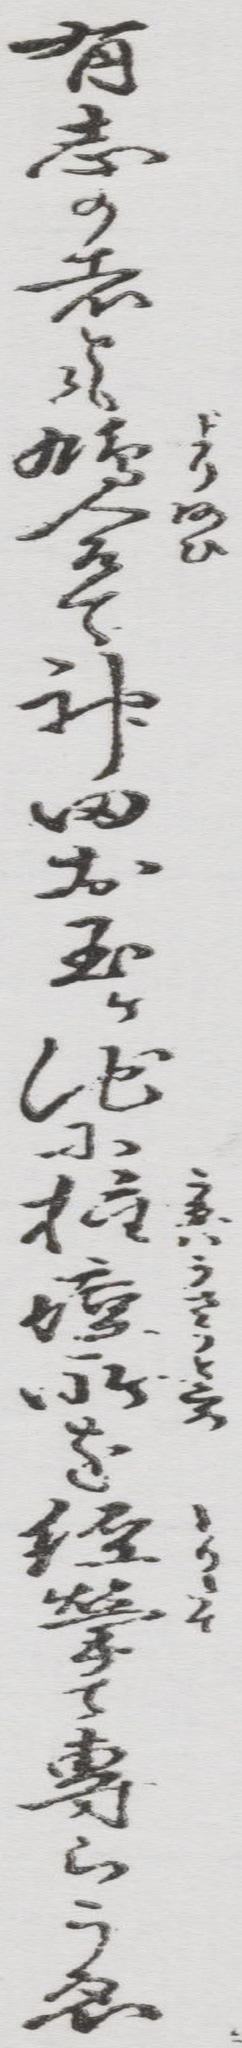有志の者も鳩合て神田お玉ヶ池に種痘所を経営て専らうゑ
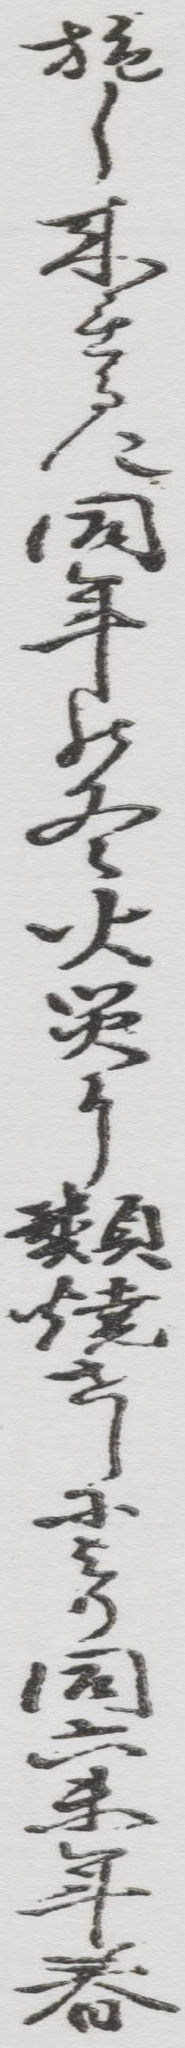施し来れるに同年の冬火災に類焼せしにより同六未年春
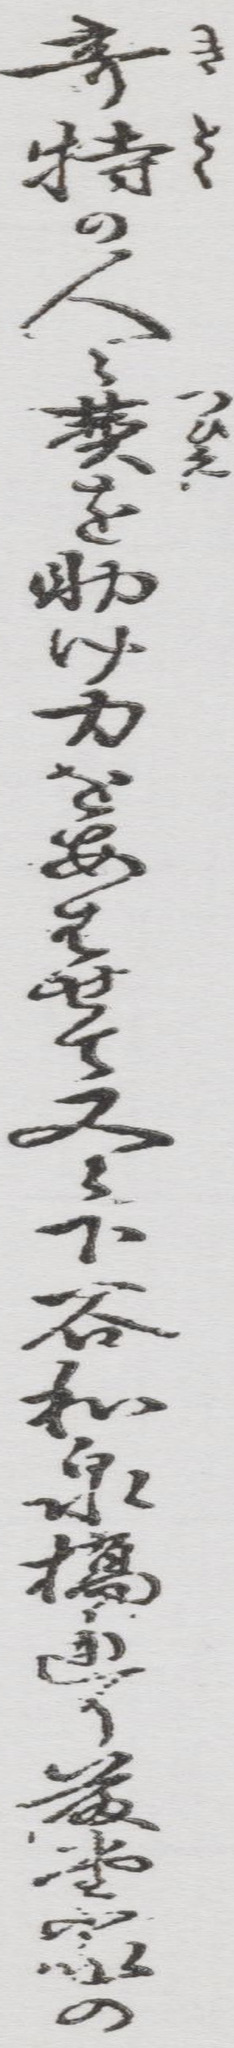奇特の人々費を助け力をあはせて又々下谷和泉橋通り藤堂家の
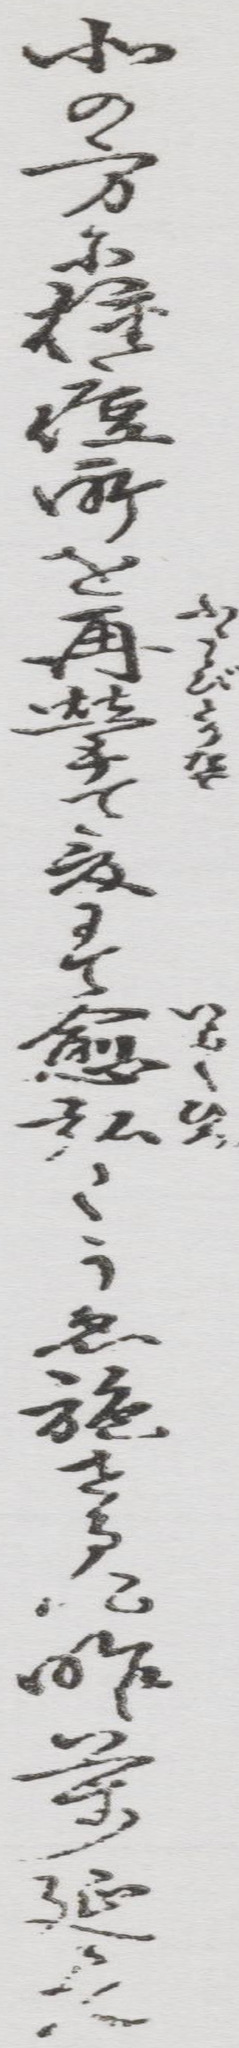北の方に種痘所を再営て爰にて愈弘くうゑ施せるに昨万延元
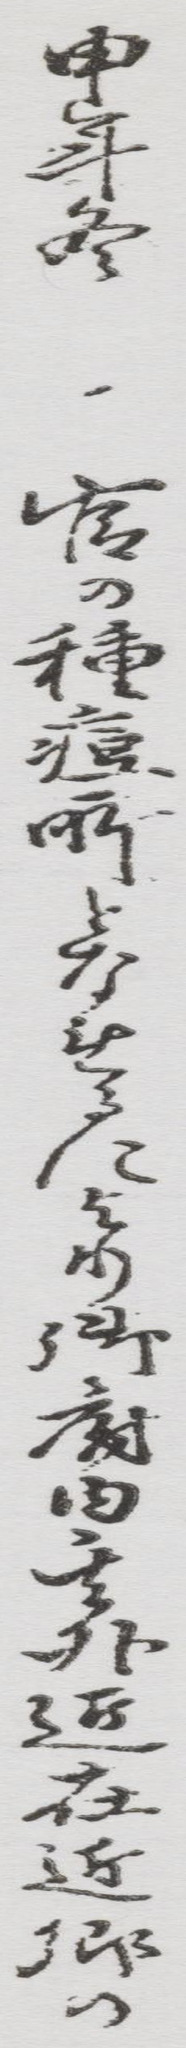申年冬官の種痘所となれるにより御府内其外近在近郷の
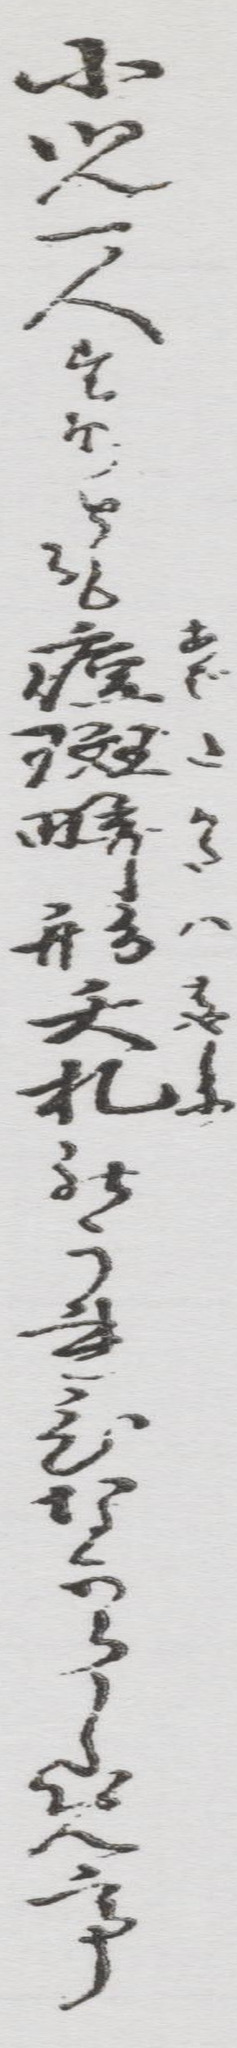小児一人たりとも痘斑畸形夭札のうれひなからしめて
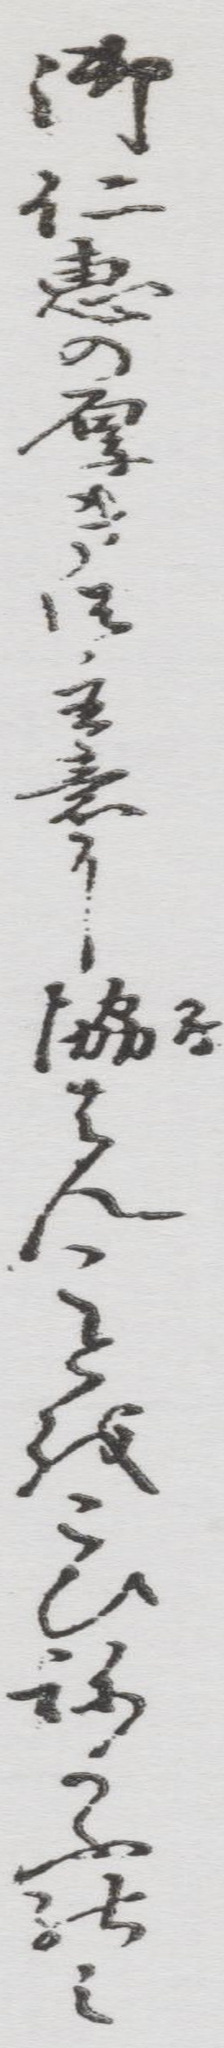御仁恵の厚き御主意に協はんことをこひねかふのみ
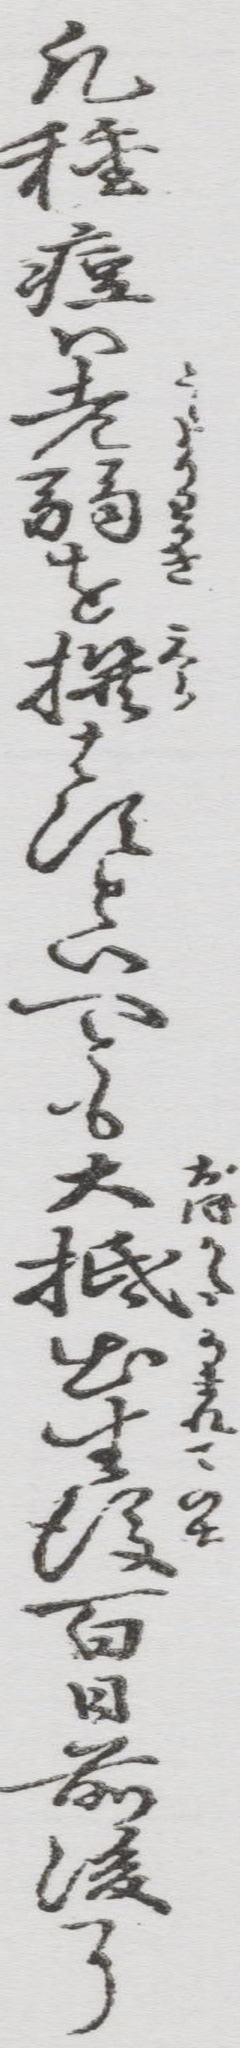凡種痘は老弱を撰はすといへとも大抵出生後百日前後に
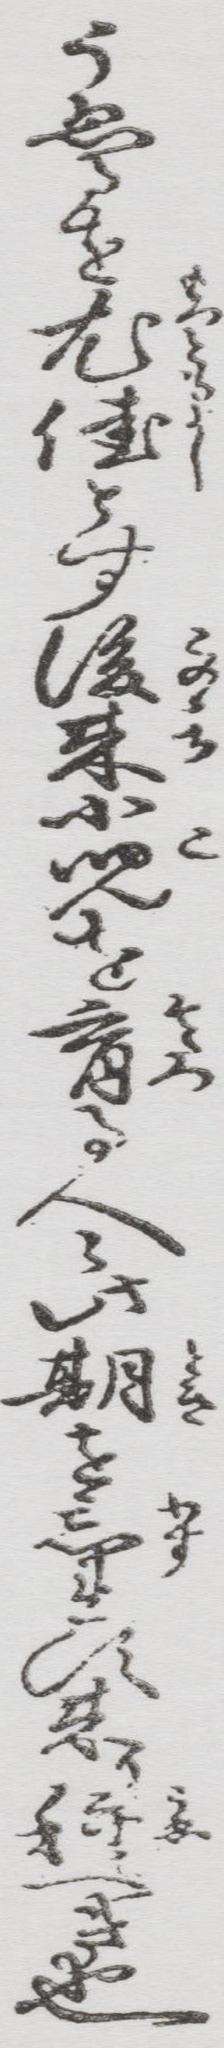うゑるを尤佳とす後来小児を育る人々は期を忘れす来り種へき也
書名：種痘諭文
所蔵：東京大学医学図書館 Medical Library, The University of Tokyo, JAPAN
